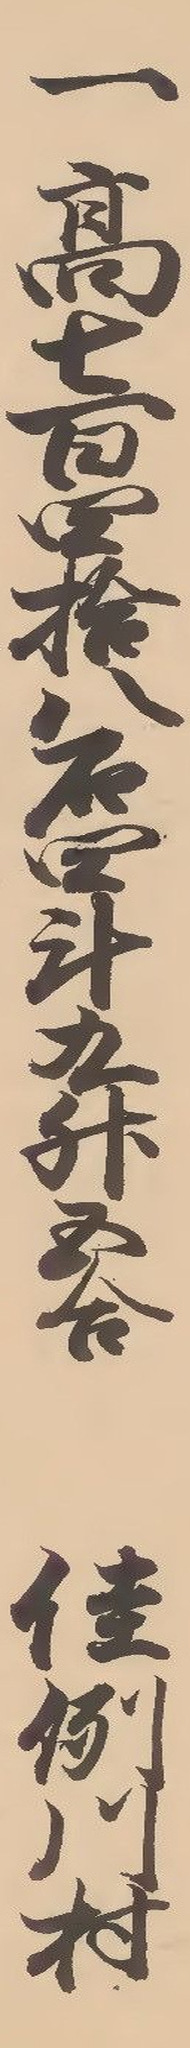一高七百四拾八石四斗九升五合佳例川村
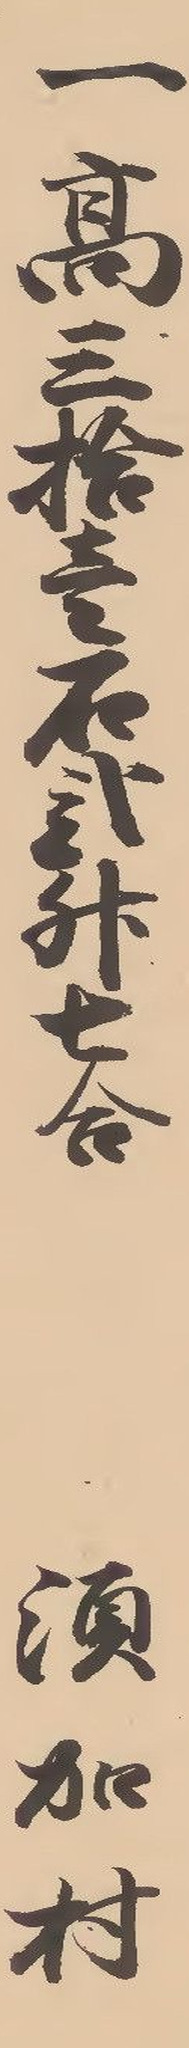一高三拾壱石弐升七合須加村
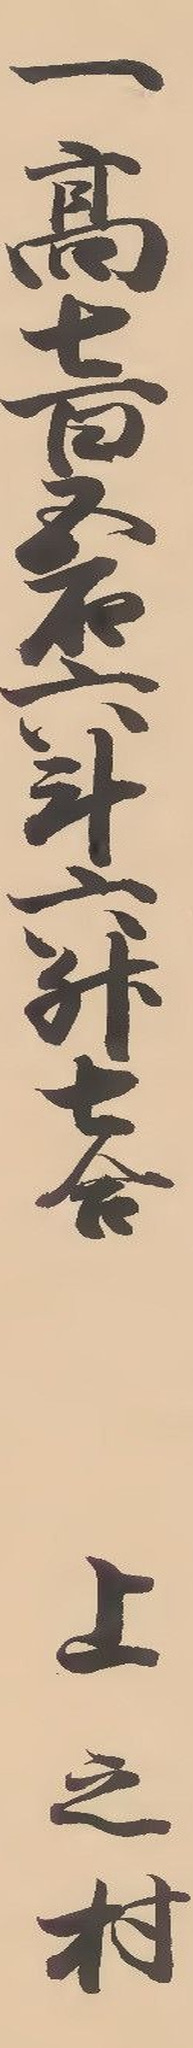一高七百五石六斗六升七合上之村
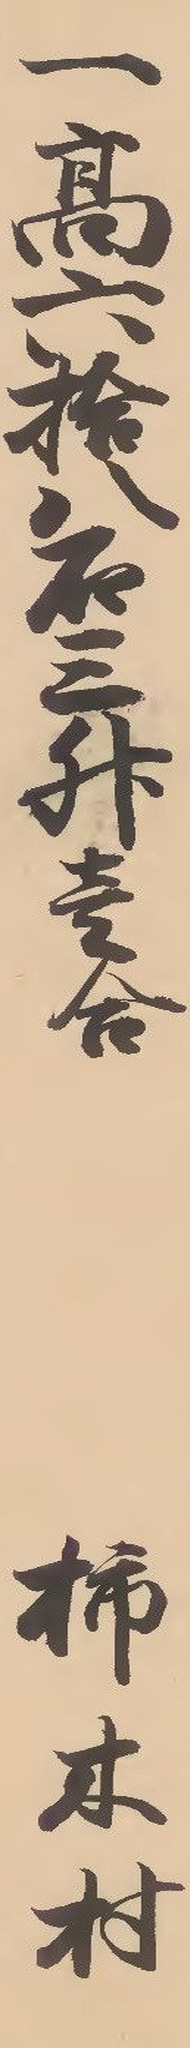一高六拾八石三升壱合柿木村
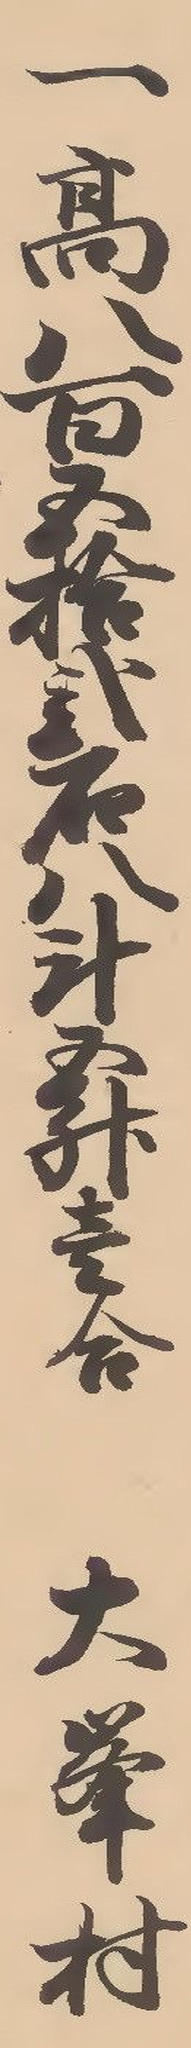一高八百五拾弐石八斗五升壱合大峰村
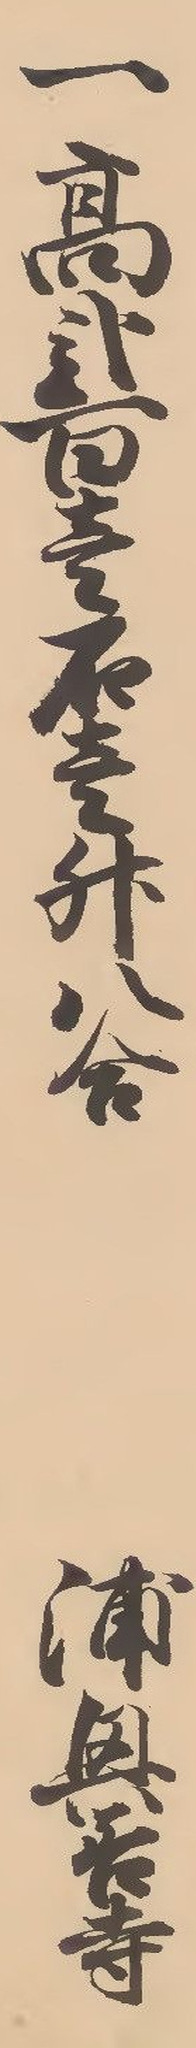一高弐百壱石壱升八合浦興善寺

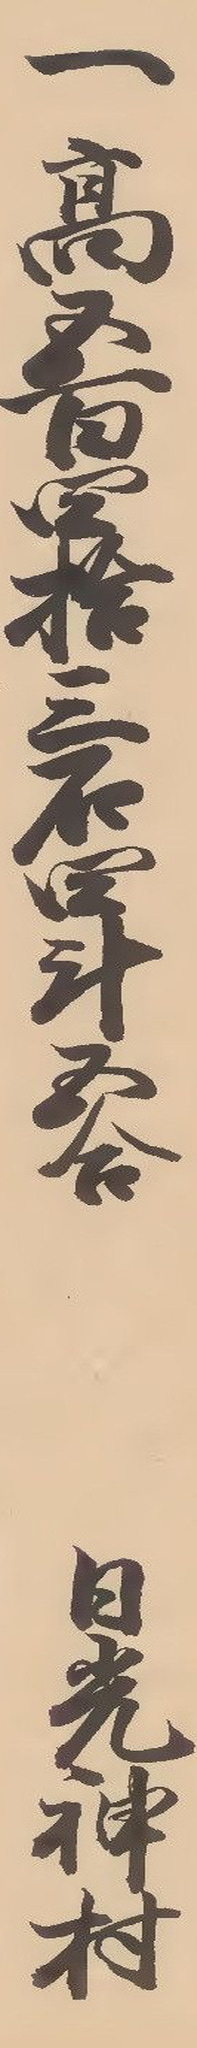一高五百四拾三石四斗五合日光神村
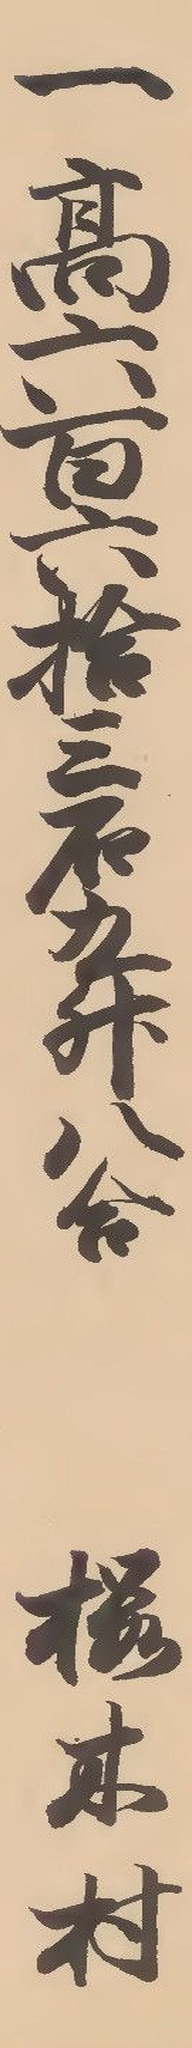一高六百六拾三石九升八合桜木村
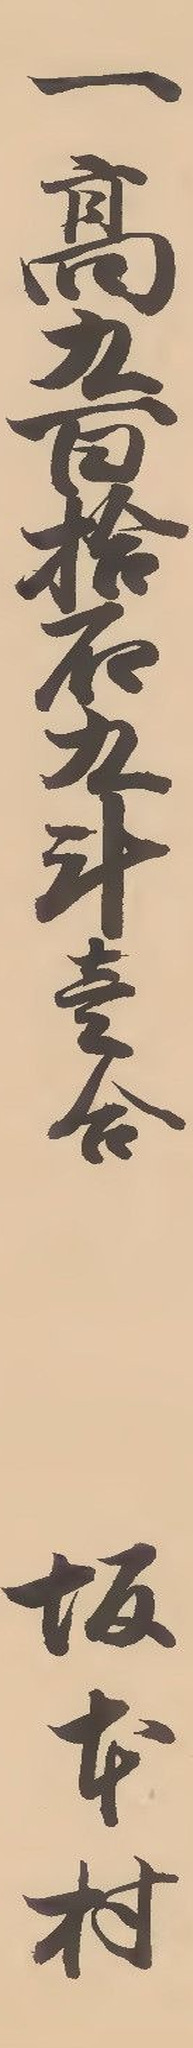一高九百拾石九斗壱合坂本村
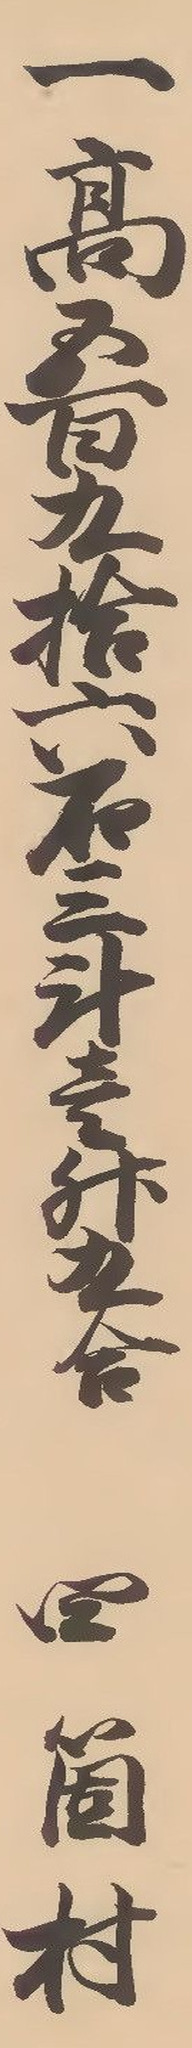一高五百九拾六石三斗壱升九合四箇村
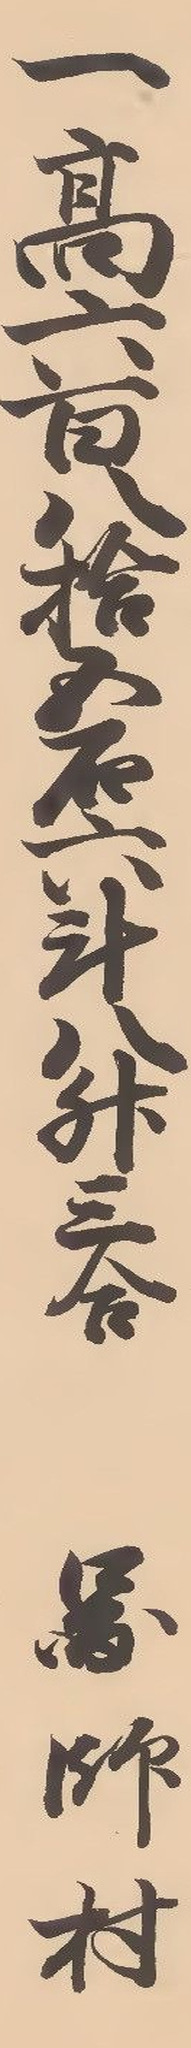一高六百八拾五石六斗八升三合図師村
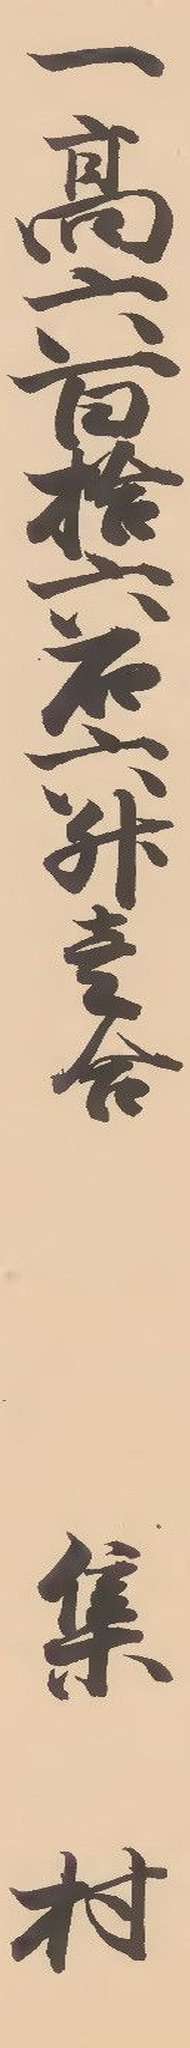一高六百拾六石六升壱合集村
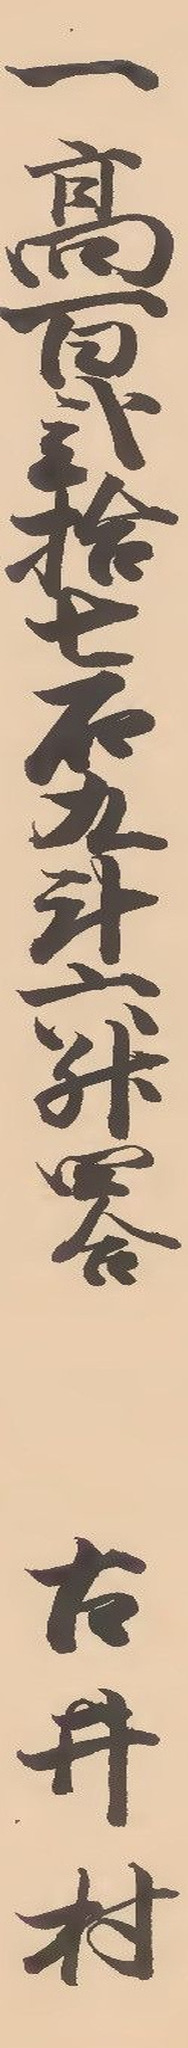一高百弐拾七石九斗六升四合古井村
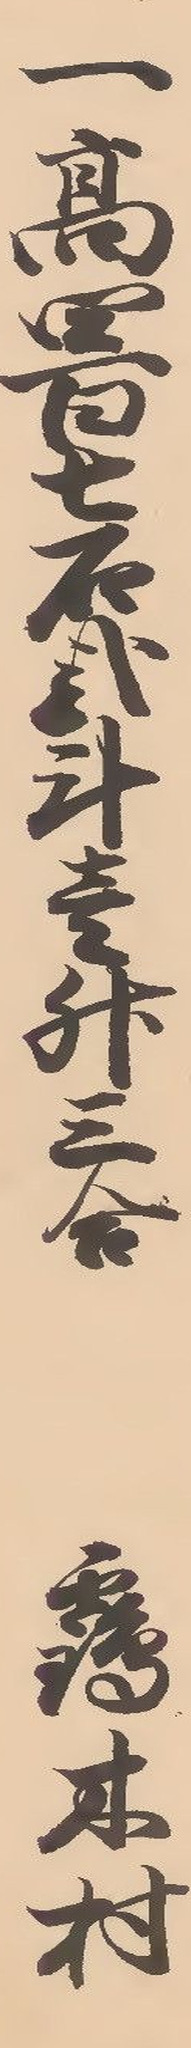一高四百七石弐斗壱升三合鶴木村

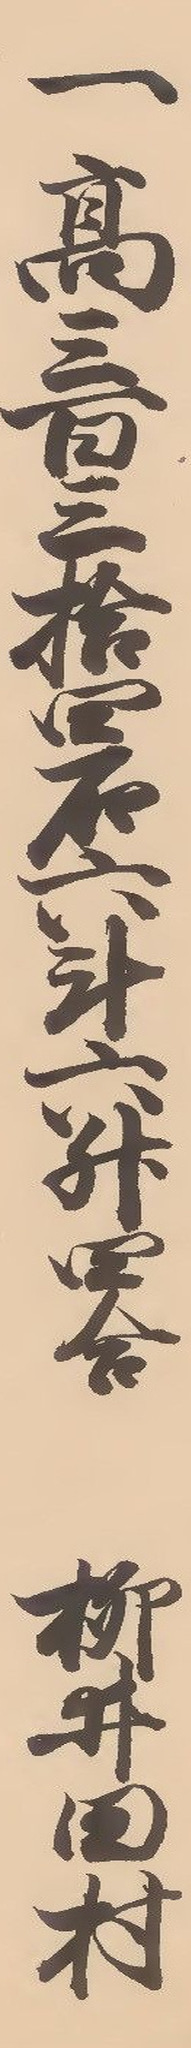一高三百三拾四石六斗六升四合柳井田村
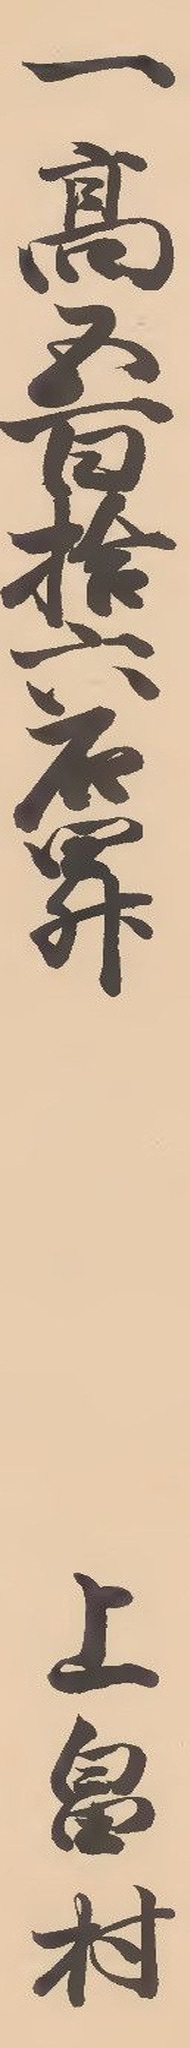一高五百拾六石四升上畠村
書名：大隅国郷帳
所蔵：国立公文書館 National Archives of Japan
